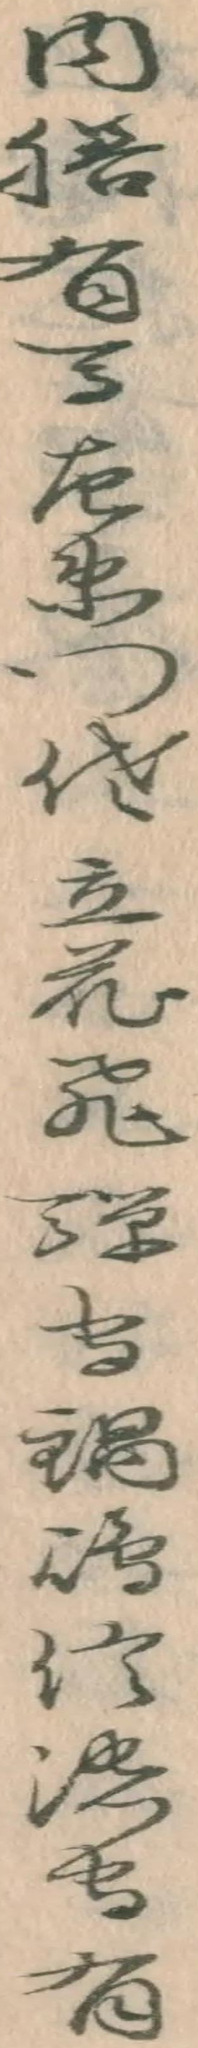内膳有馬左衛門佐立花飛騨守鍋島信濃守有
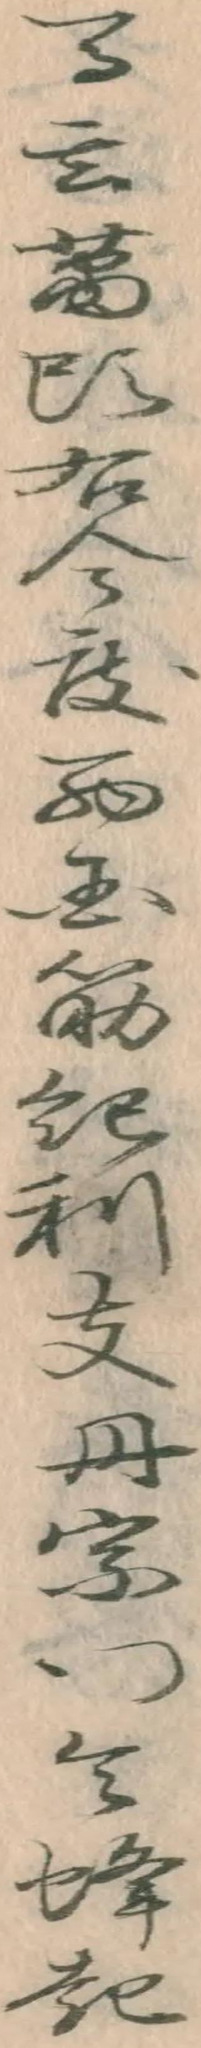馬玄蕃頭右今度西国筋紀利支丹宗門令蜂起
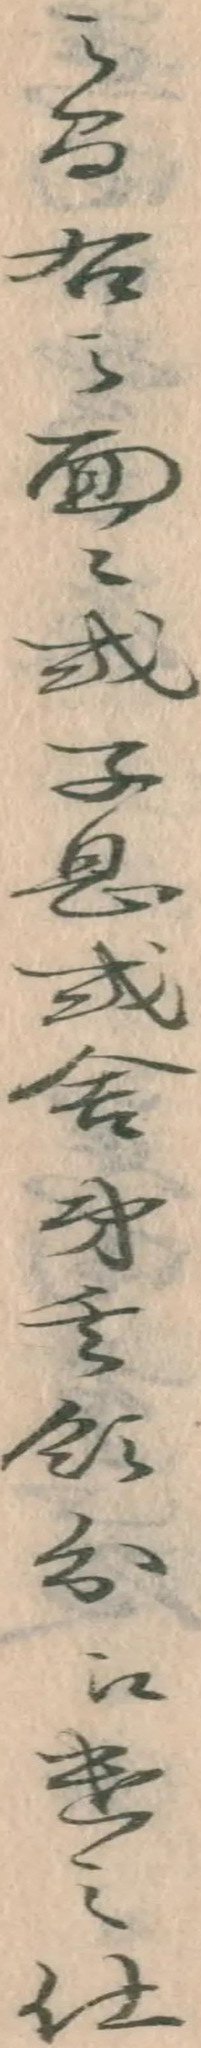之間右之面々或子息或舎弟其領分江遣之仕
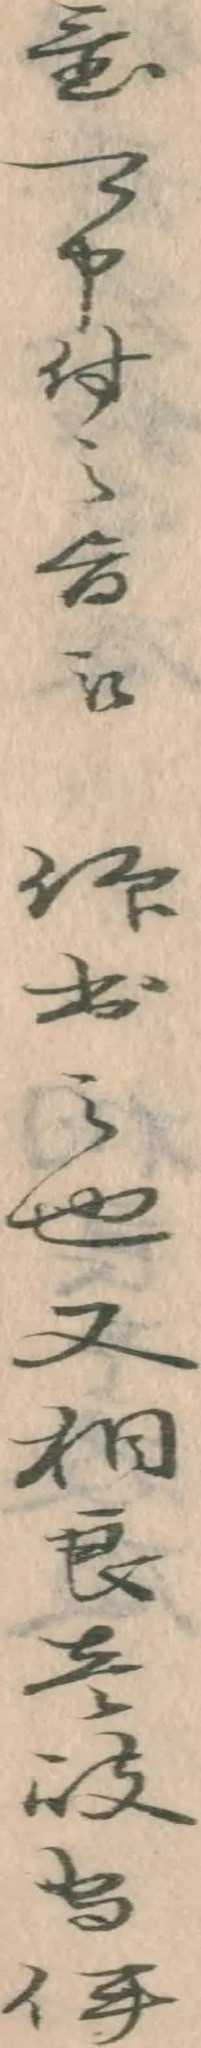置可申付之旨被仰出之也又相良壱岐守伊
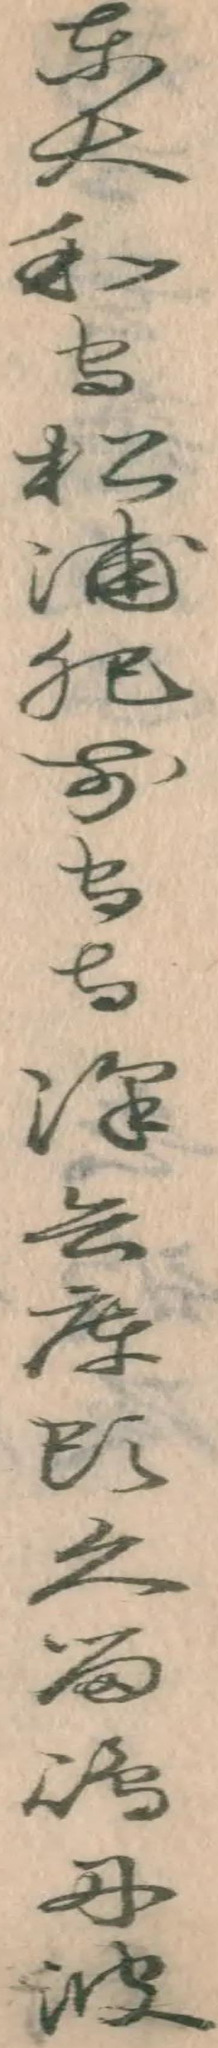東大和守松浦肥前守寺沢兵庫頭久留島丹波
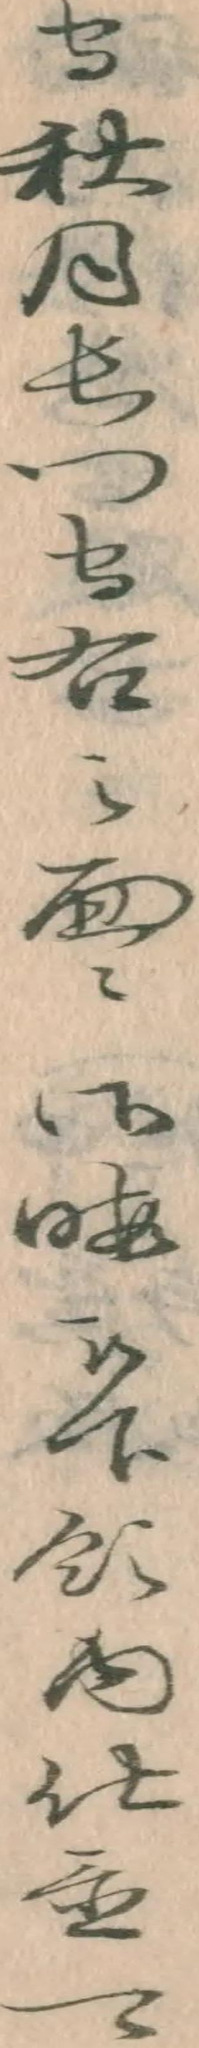守秋月長門守右之面々御暇被下領内仕置可
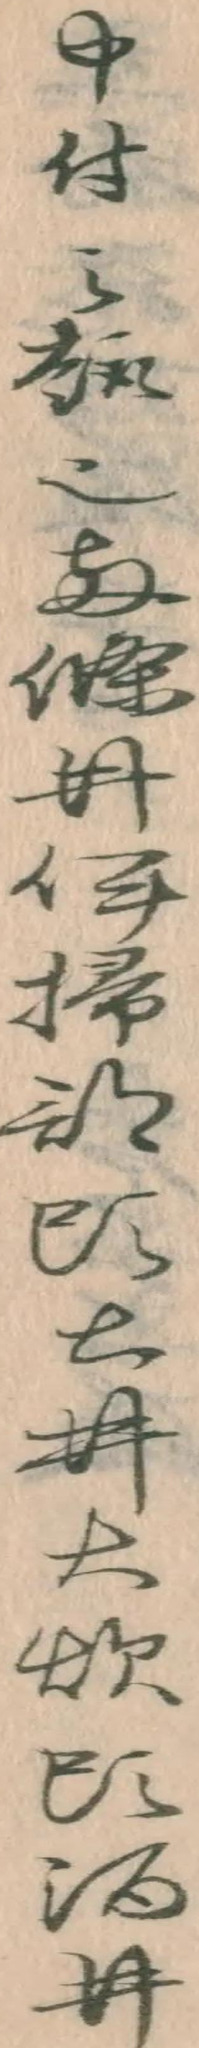申付之極也両條井伊掃部頭大井大炊頭酒井
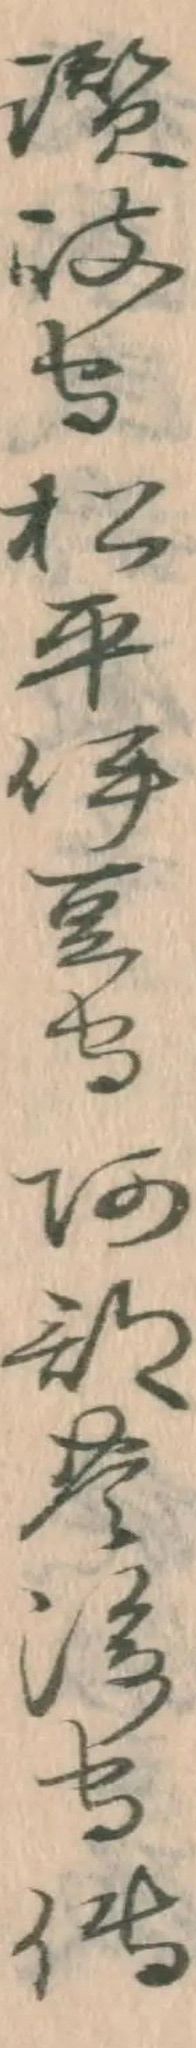讃岐守松平伊豆守阿部豊後守伝
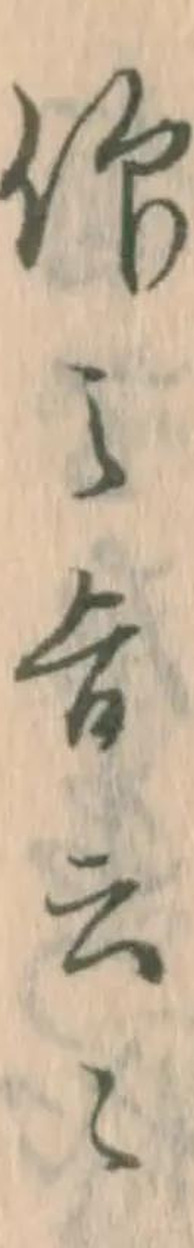仰之旨云々
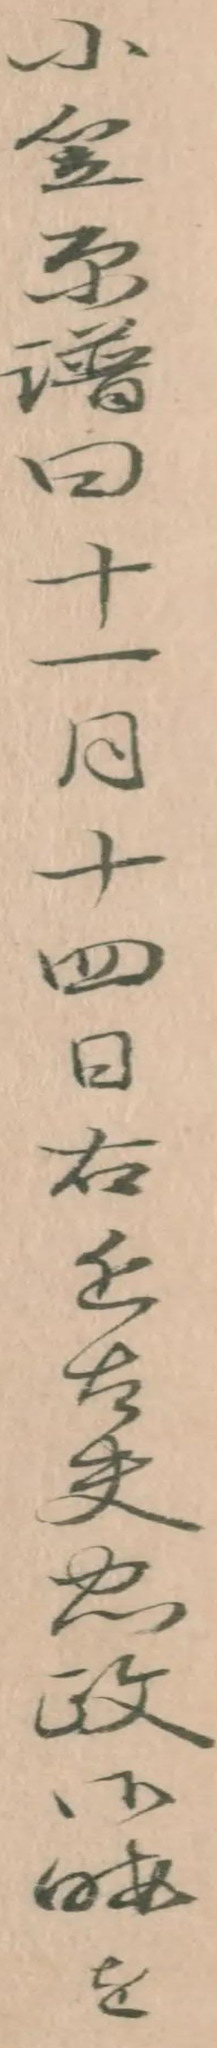小笠原譜曰十一月十四日右近太夫忠政御暇を
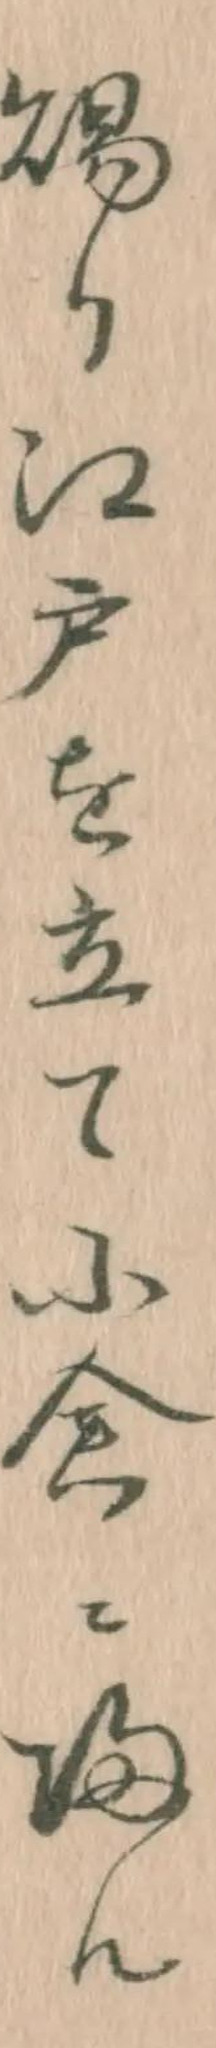賜り江戸を立て小倉に帰る
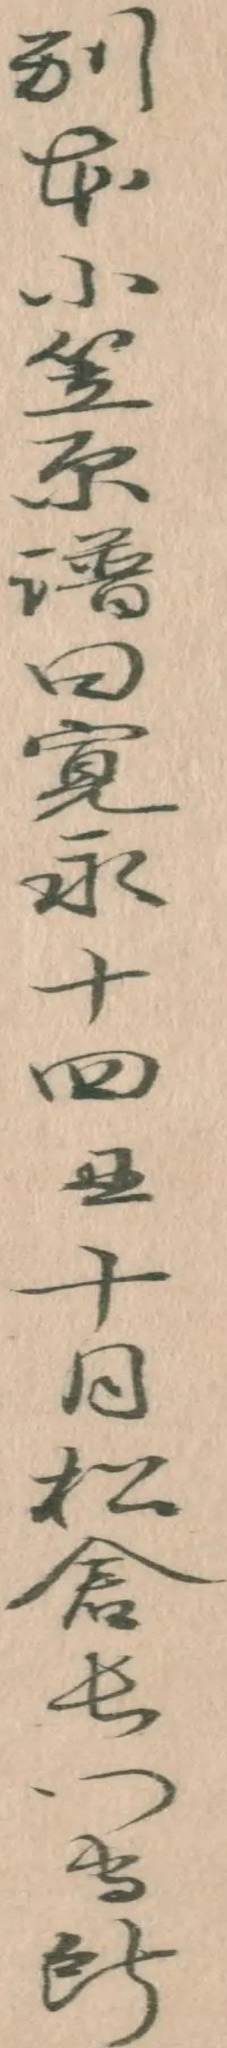別本小笠原譜曰寛永十四丑十月松倉長門守所
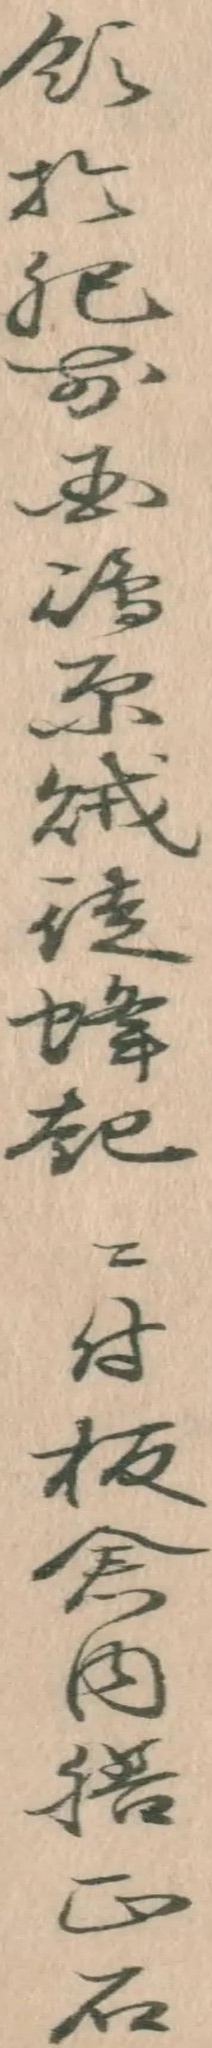領於肥前国島原賊徒蜂起に付板倉内膳正石
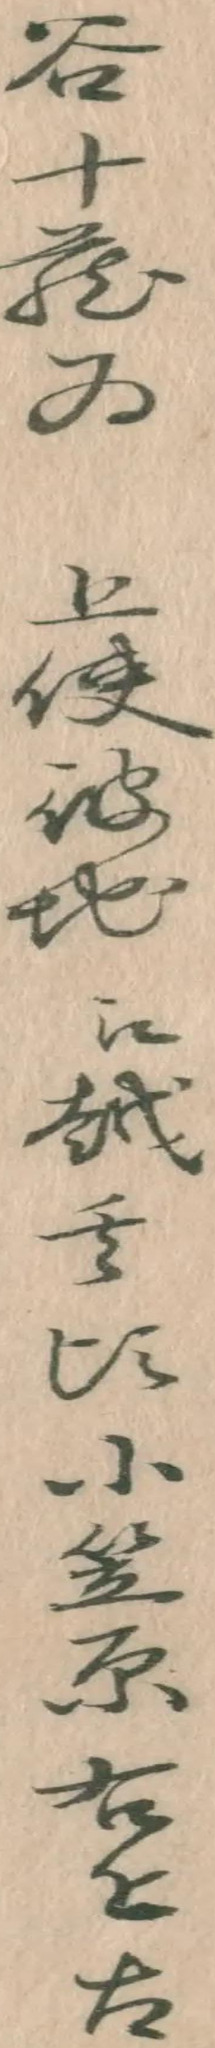谷十蔵ゐ上使彼地江越其頃小笠原右近太
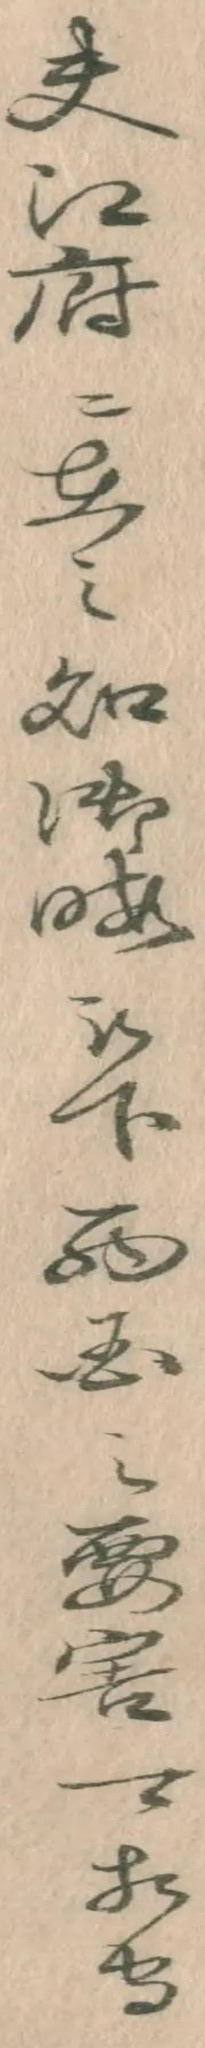夫江府に在之処御暇被下西国之要害可相守
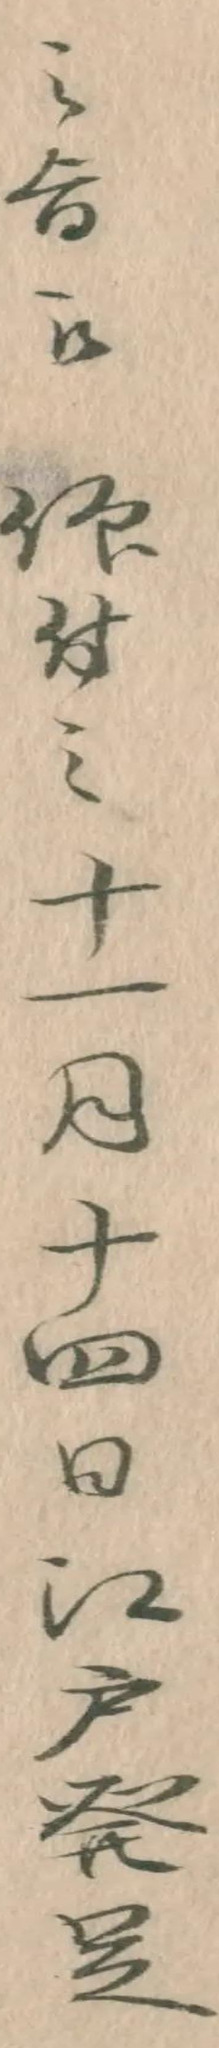之旨被仰付之十一月十四日江戸発足
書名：切支丹御退治記 49巻. [2]
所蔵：国立国会図書館 National Diet Library, JAPAN
